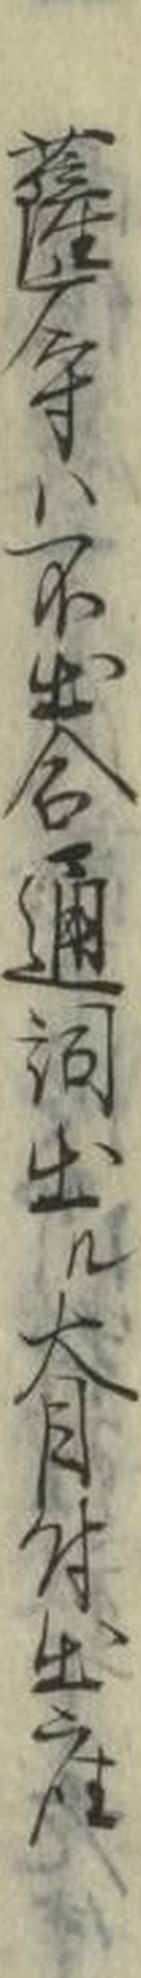薩摩守は不出合通詞出る大目付出座
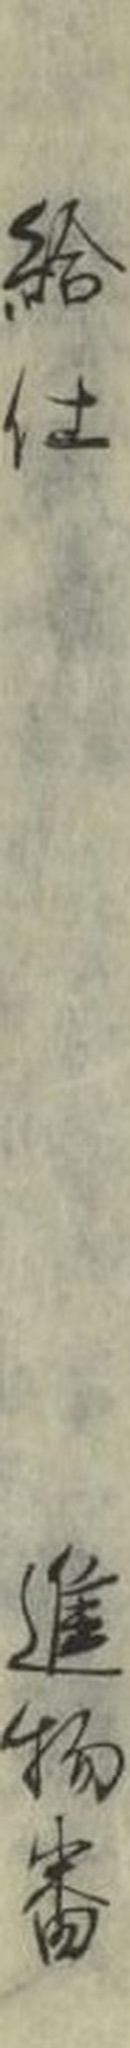給仕進物番
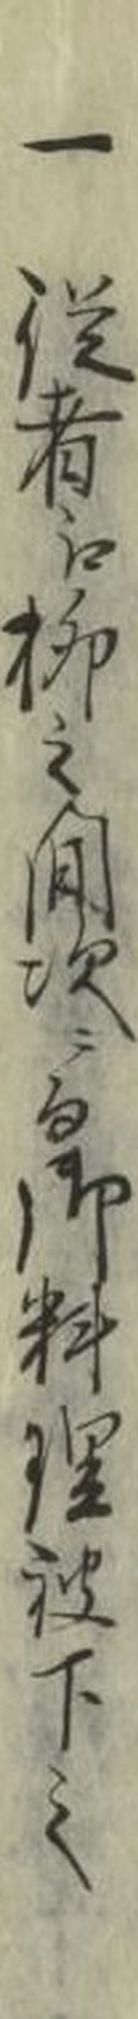一従者え柳之間次に而御料理被下之
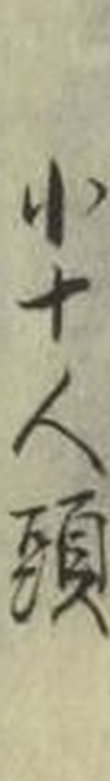小十人頭
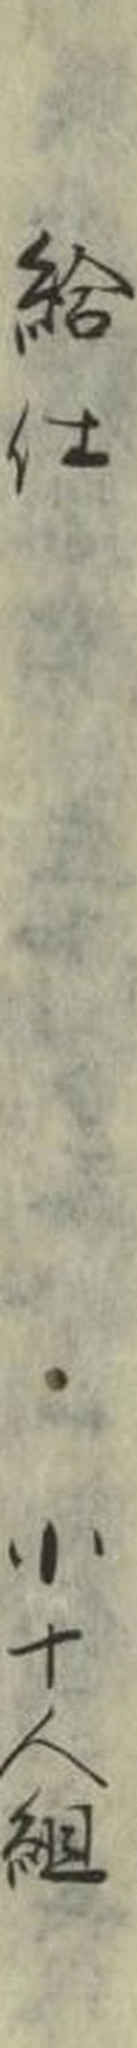給仕小十人組
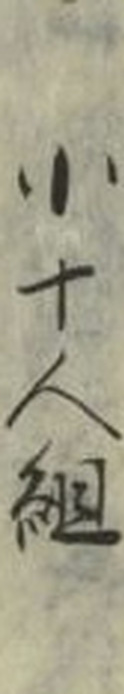小十人頭
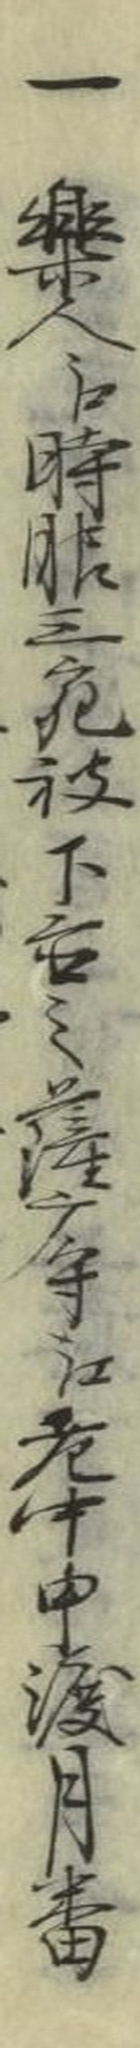一楽人え時服三宛被下置之薩摩守え老中申渡月番
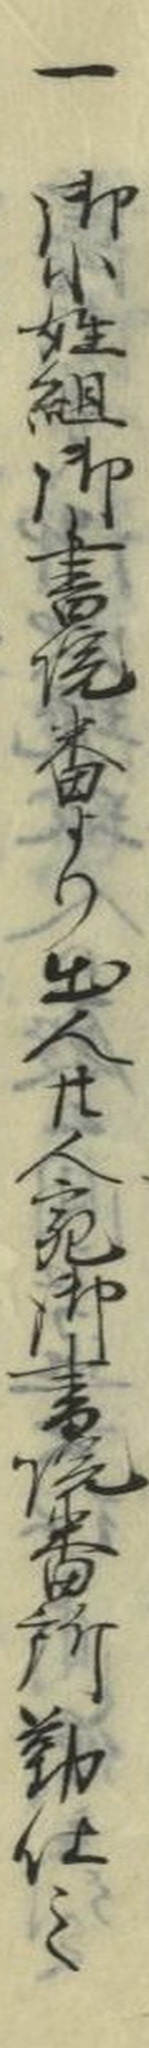一御小姓組御書院番より出人廿人宛御書院番所勤仕之
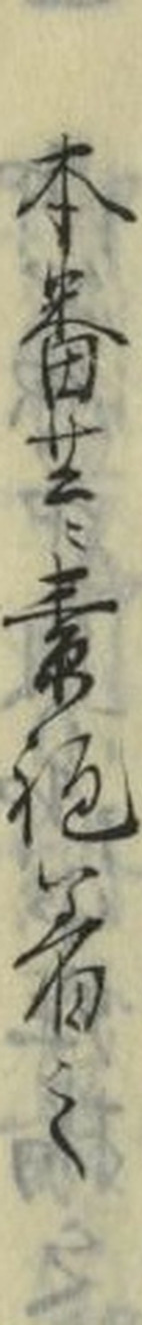本番共に素袍着之
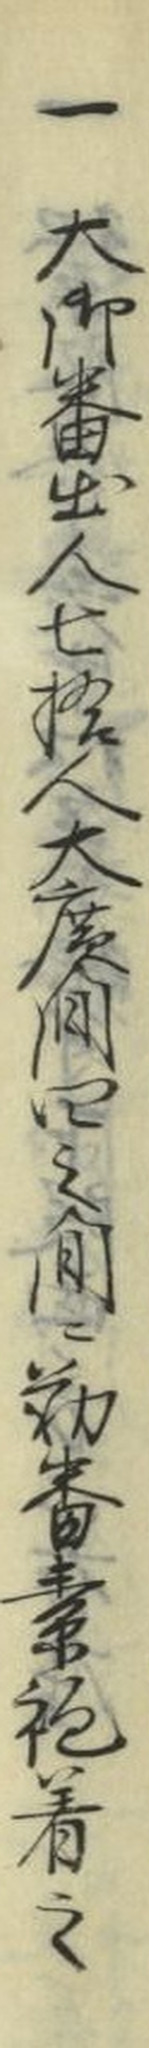一大御番出人七拾人大広間四之間に勤番素袍着之
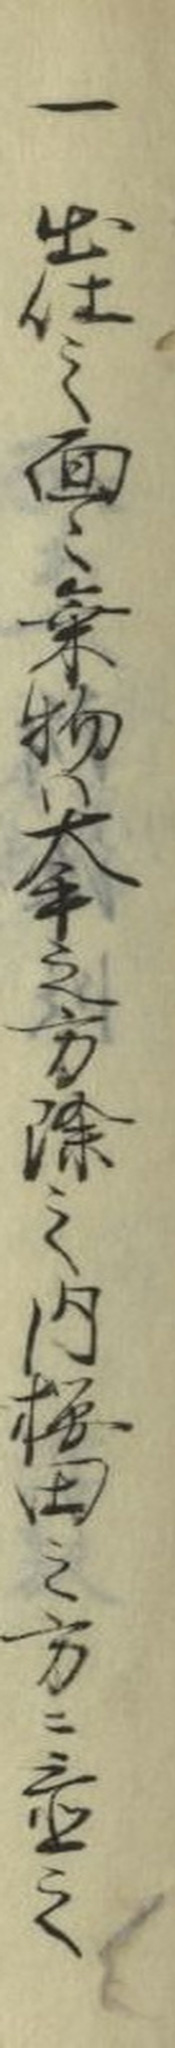一出仕之面々乗物は大手之方除之内桜田之方に置之
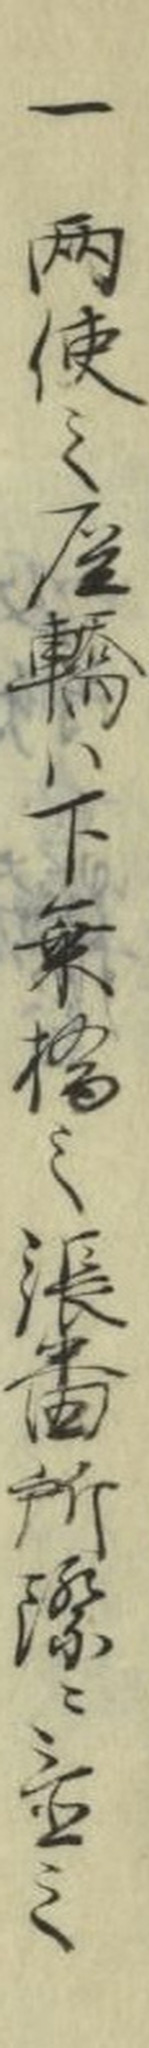一両使之屋轎は下乗橋之張番所際に置之
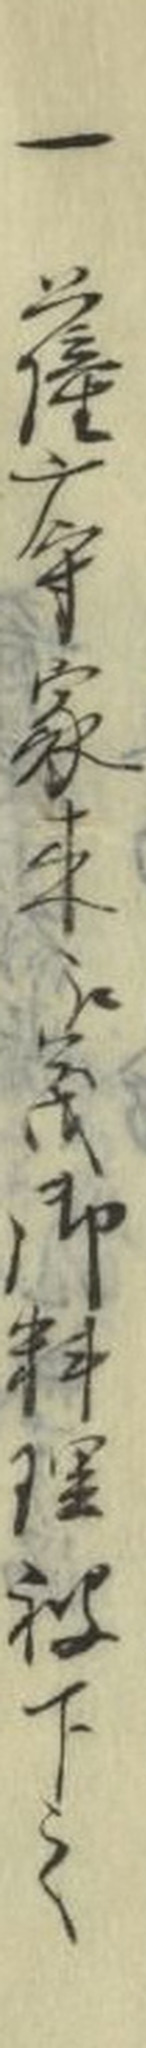一薩摩守家来えも御料理被下之
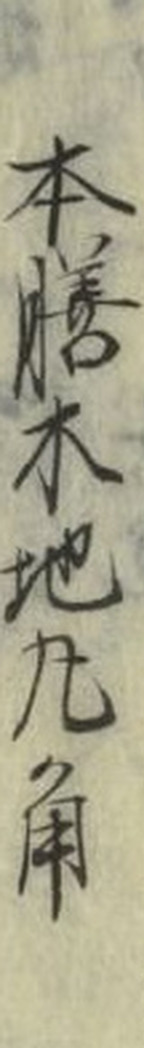本膳木地丸各
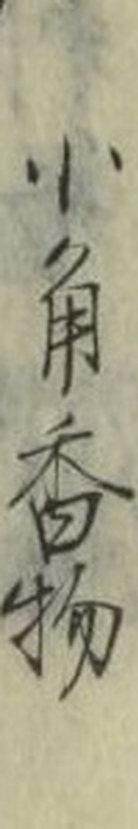小角香者

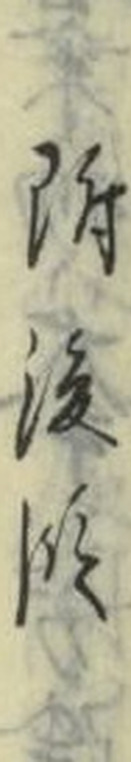附後段
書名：宝永七庚寅年琉球国来聘使日記
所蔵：University of the Ryukyus Library
